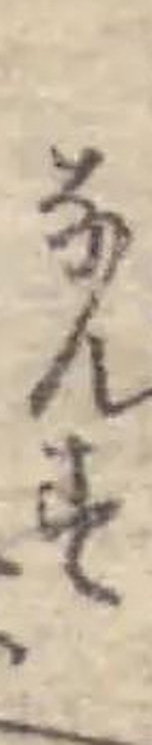なんす
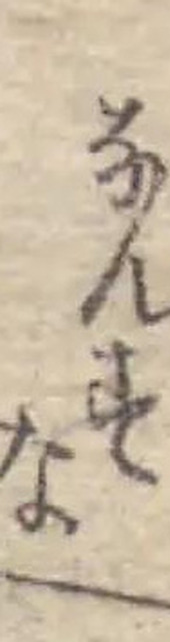なんす
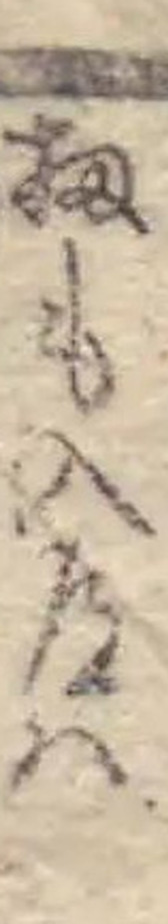扨も入道は
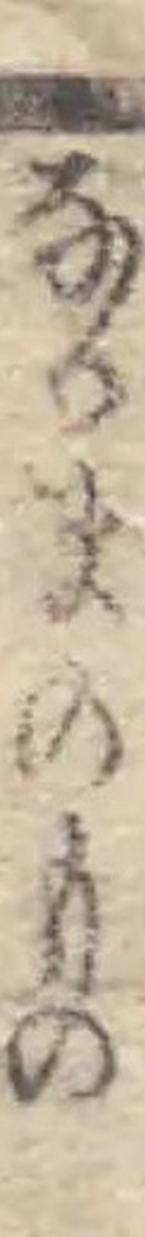なかまのもの
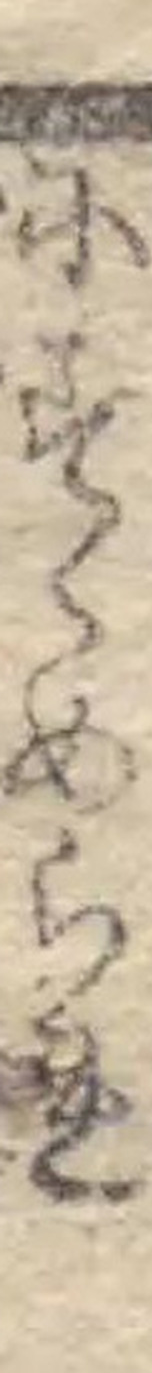にすゝめられ
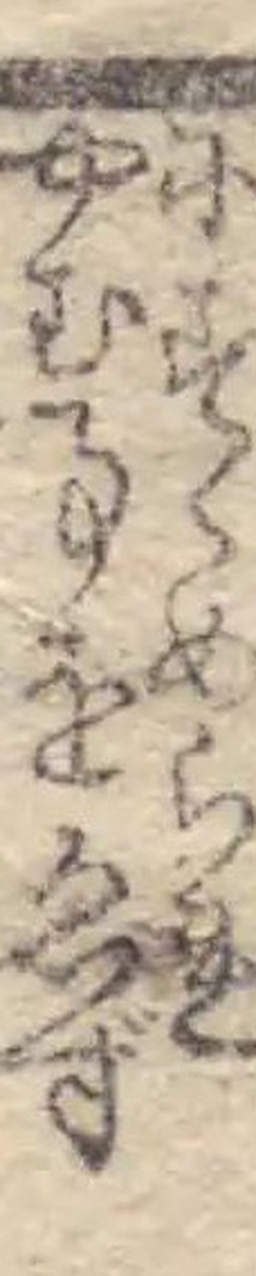やむ事をゑず
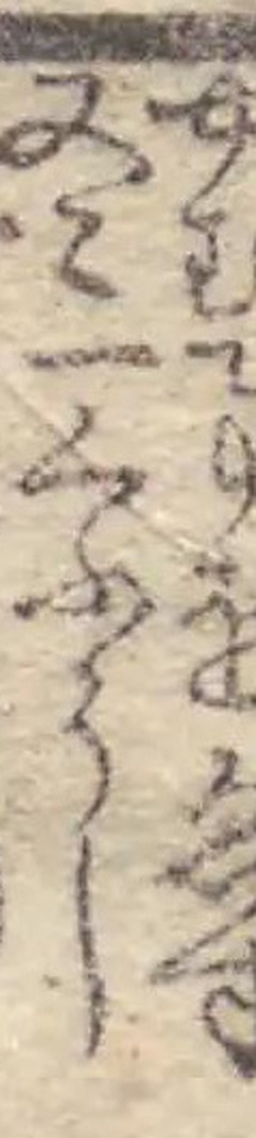又々一くふうし
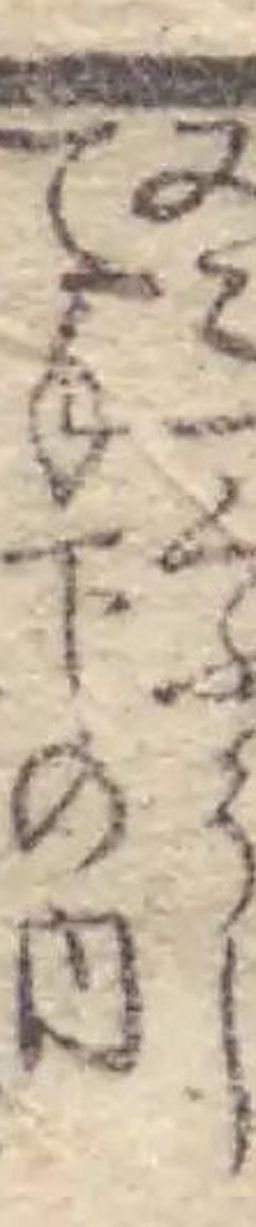て手下の内
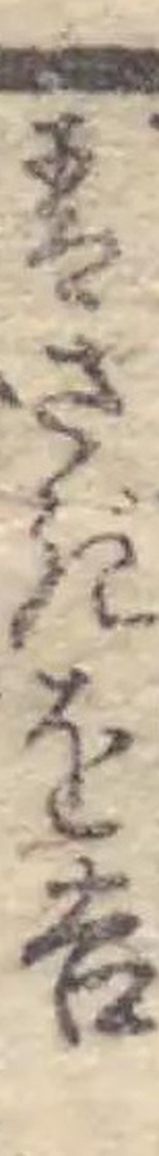青さぎを吉
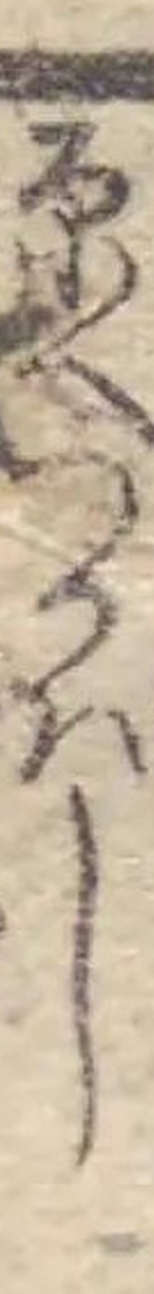原へつかはし
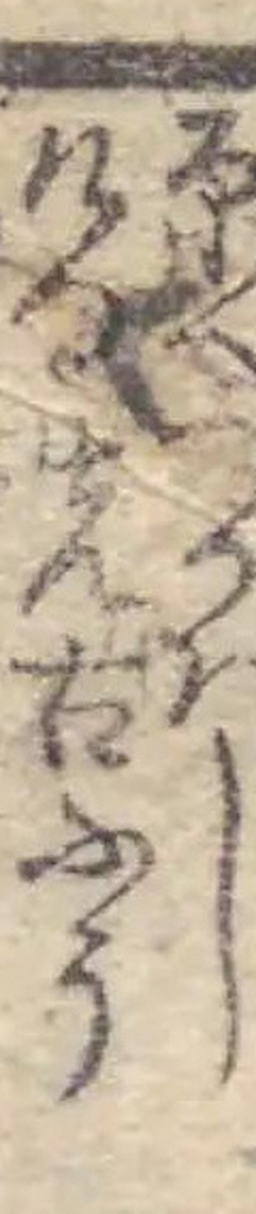ける先古ふう
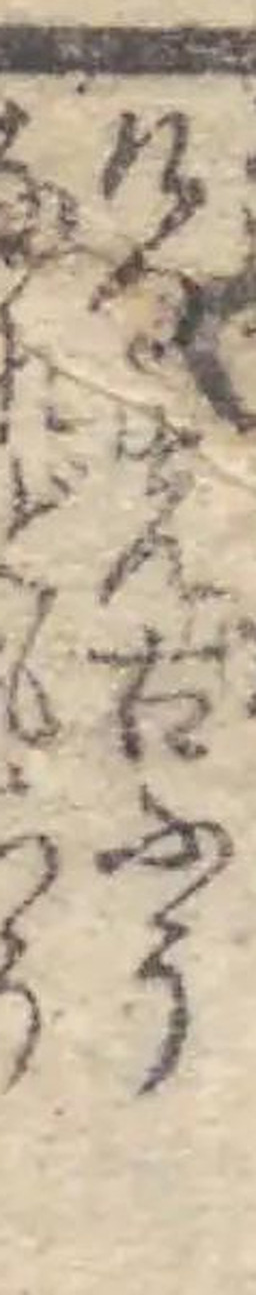なれどもらう
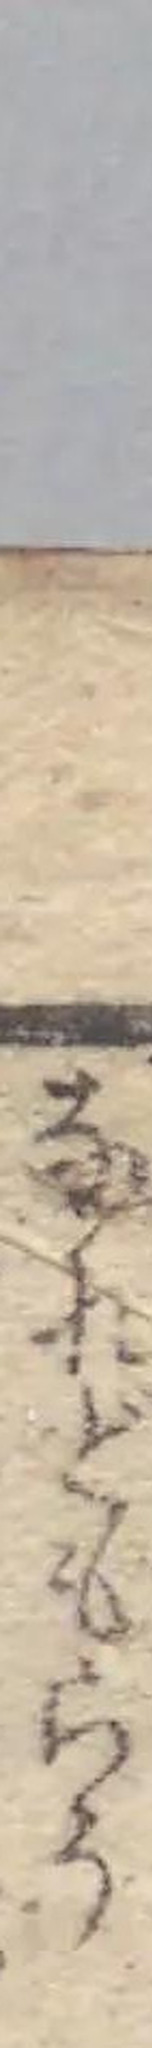なれどもらう
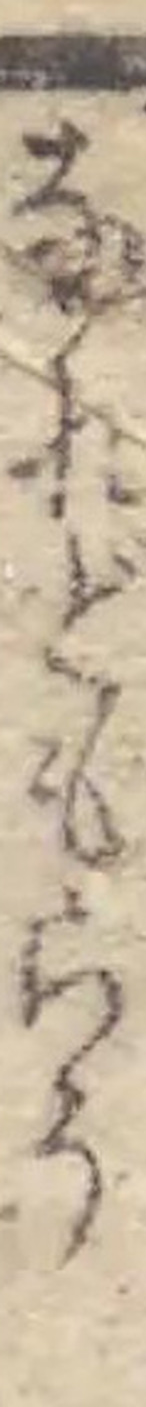なれどもらう
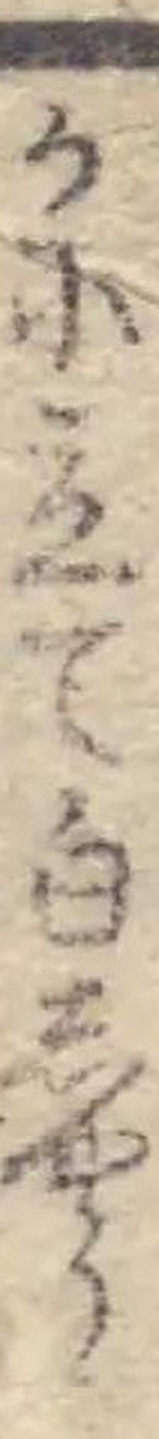かに立て白しやう
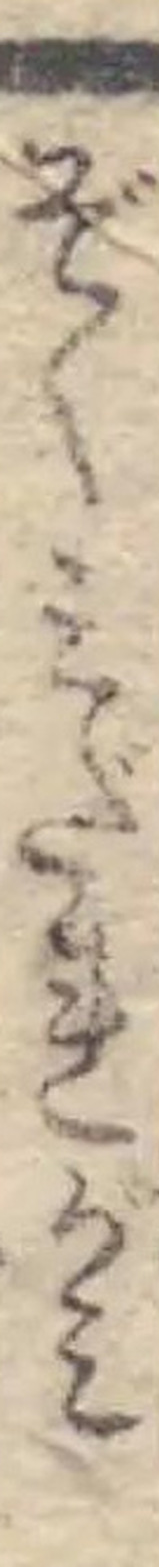ぞくみだれがみ
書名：作意妖恐懼感心 2巻
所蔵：国立国会図書館 National Diet Library, JAPAN
